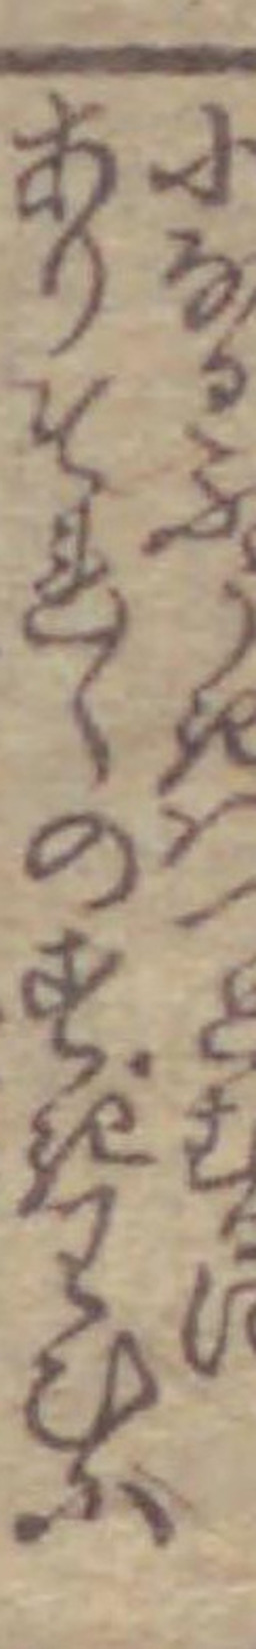ありそれ〳〵のすぎはひに
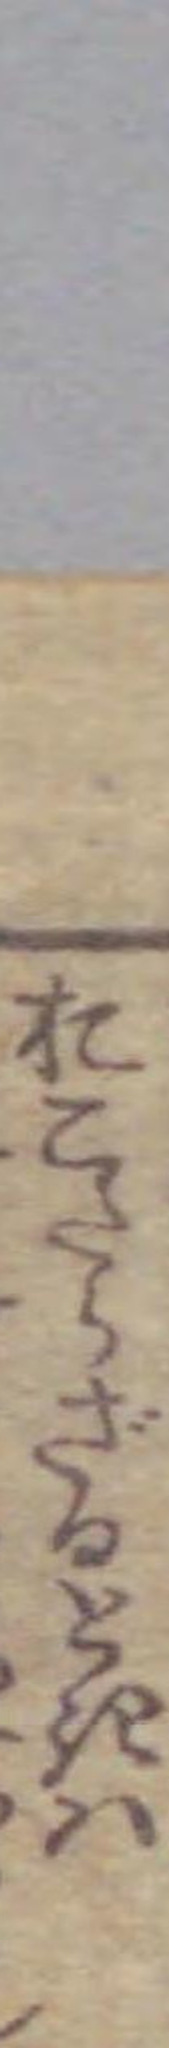おこたらざるときは
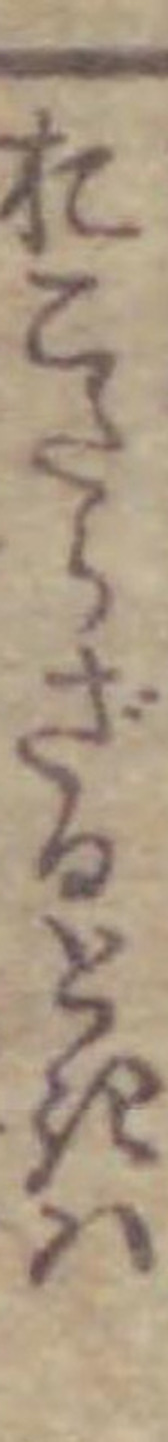おこたらざるときは
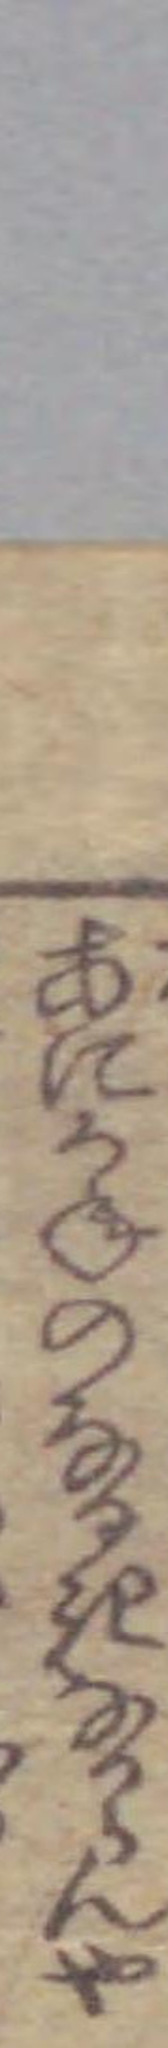あにかねのなるきならんや
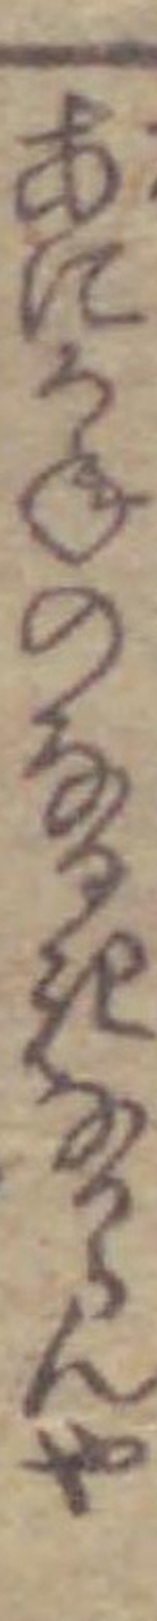あにかねのなるきならんや
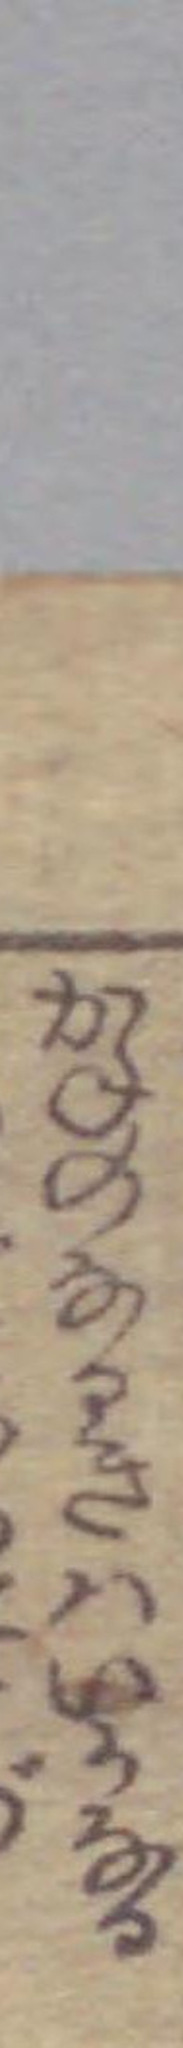かねのなるきはいかなる
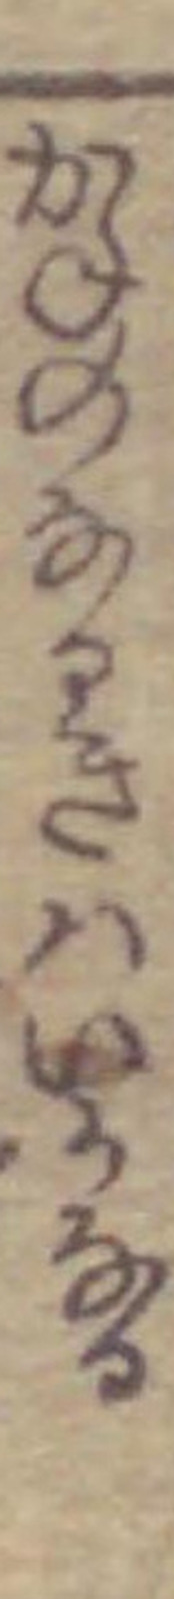かねのなるきはいかなる
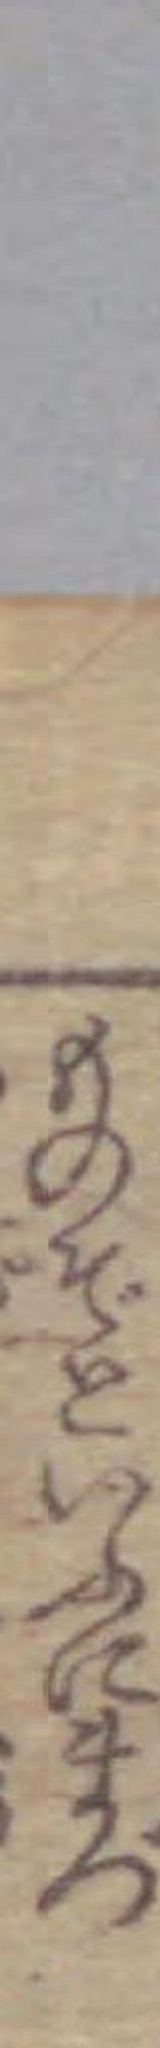ものぞといふにまづ
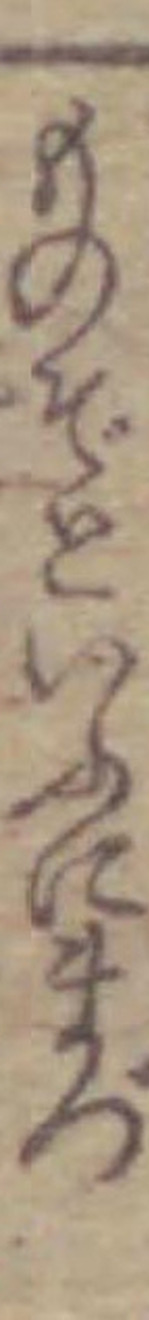ものぞといふにまづ
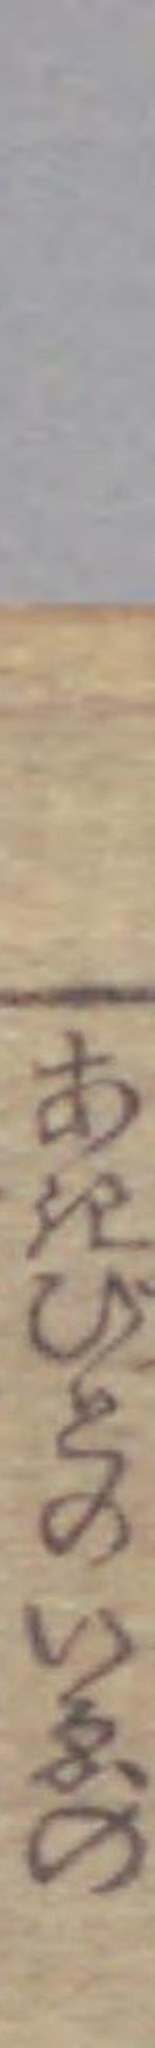あきびとのいゑの
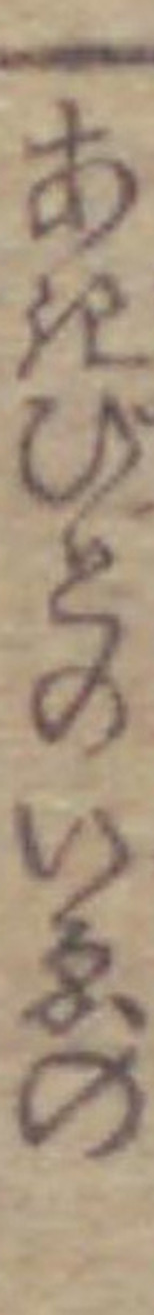あきびとのいゑの
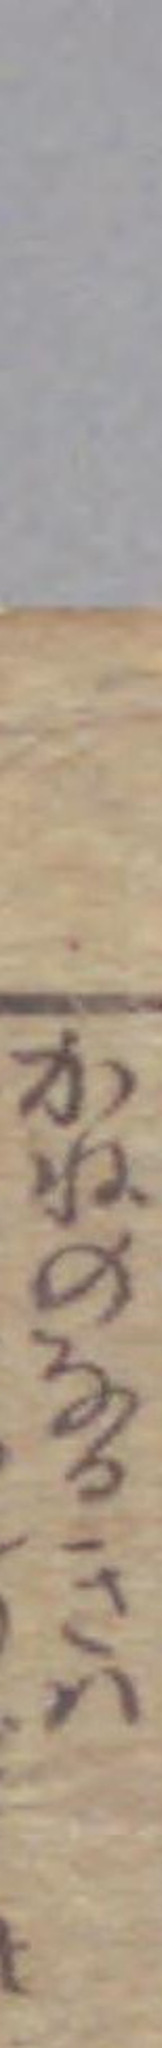かねのなるきは
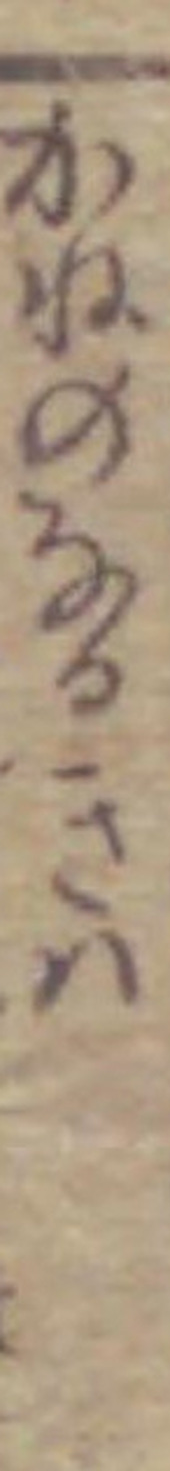かねのなるきは
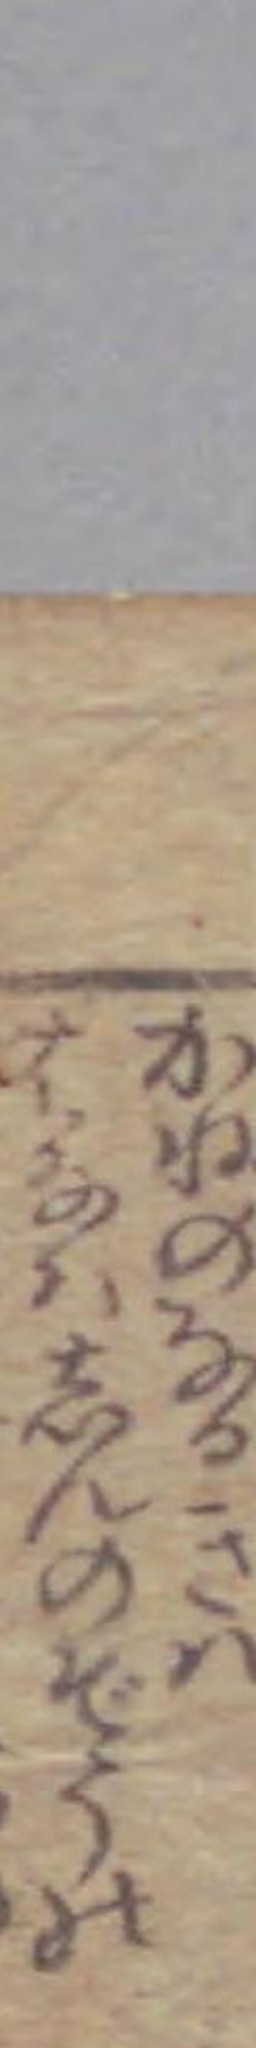はなはしんのぞうの
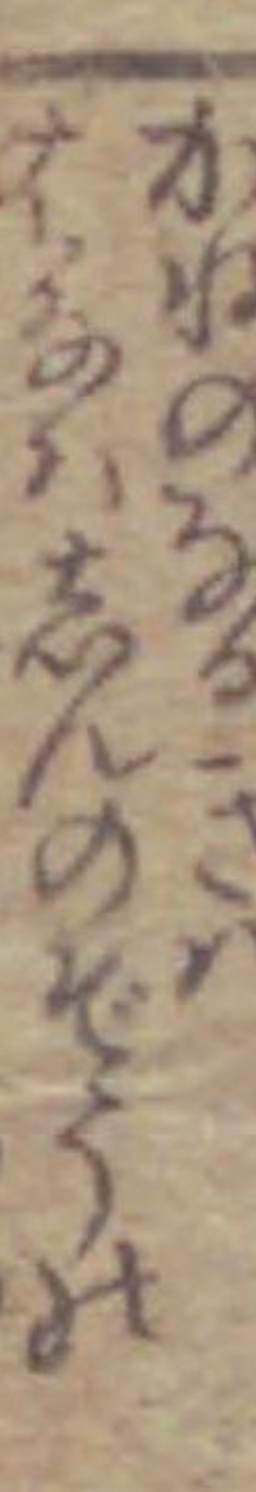はなはしんのぞうの
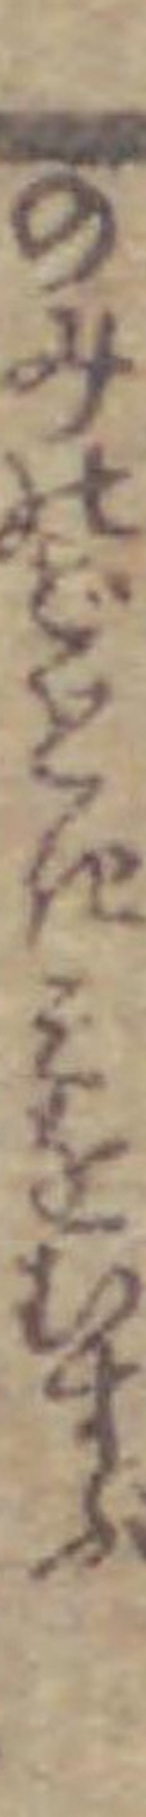のみのごときみをむすぶ
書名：化物和本草 : 3巻
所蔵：国立国会図書館 National Diet Library, JAPAN
